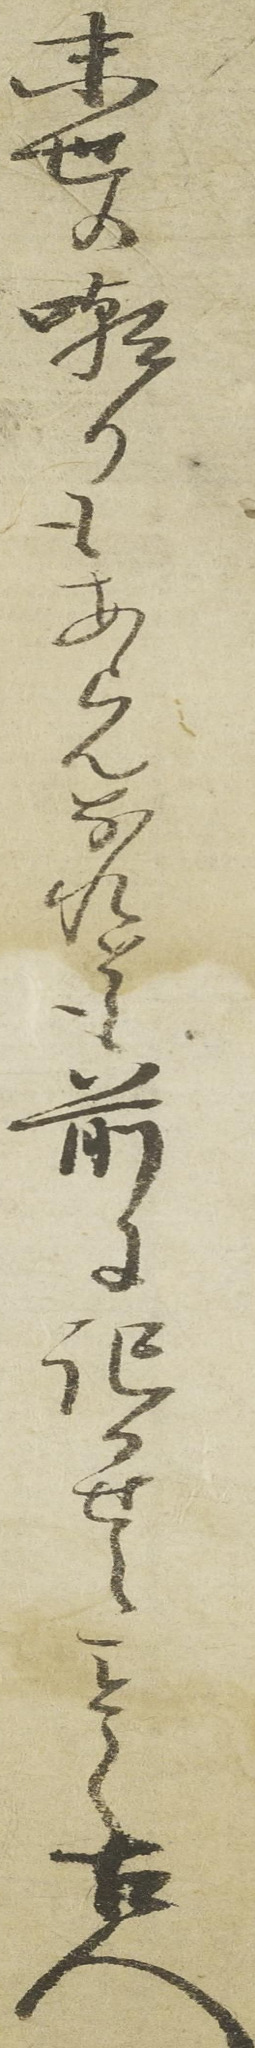末世の嘲りもあらんなれとも前に記せしことく古人
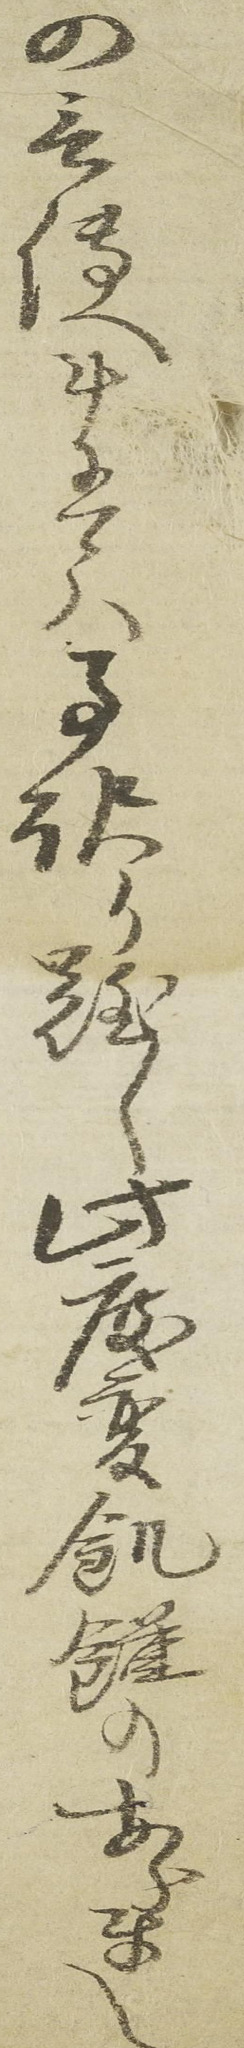の言伝へ斗にてハ事訳り難く此度変飢饉のあらまし
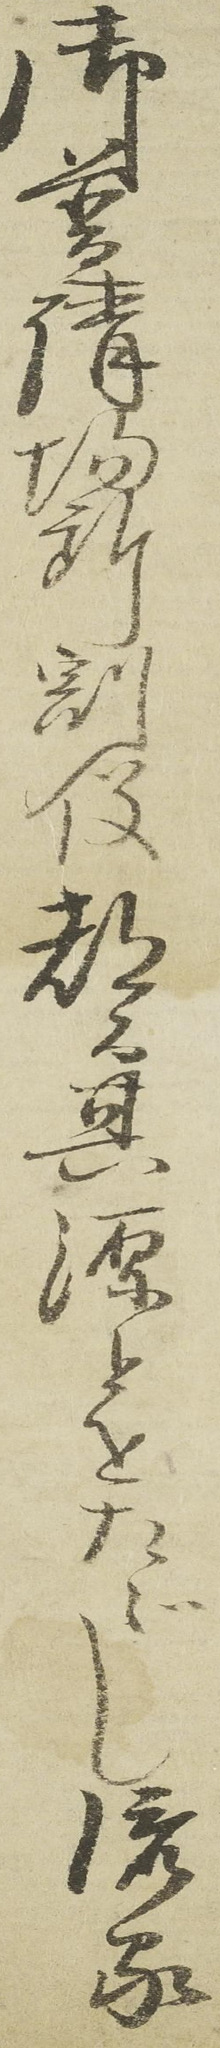御普請場所割役都而其源とをただし流家
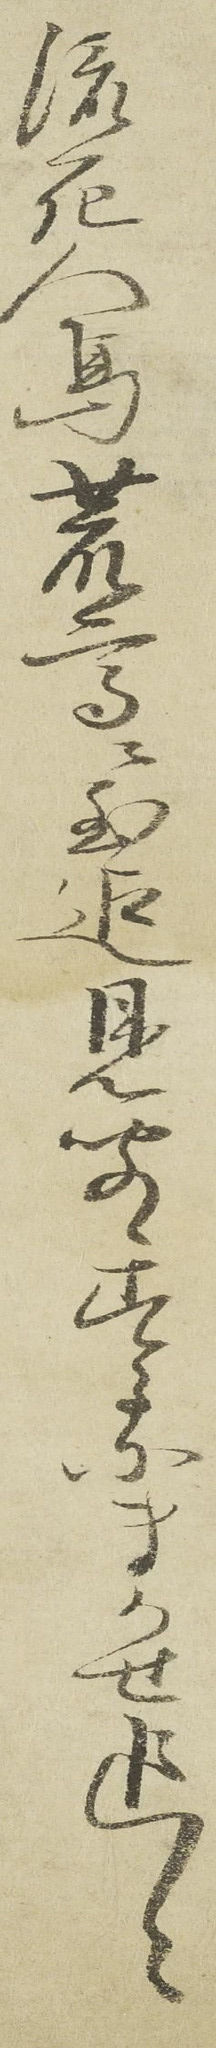流死人馬荒高ニ至迄見聞するにまかせ追々候
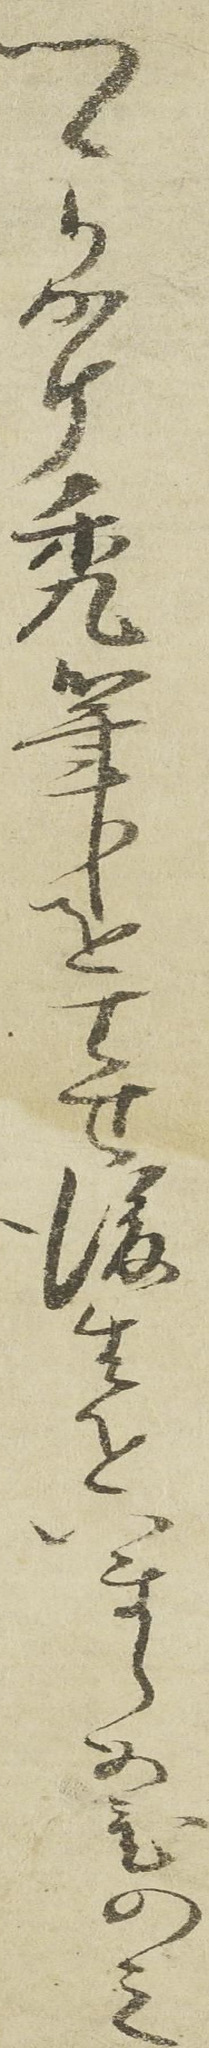つヽりかけ禿筆をませ後生をいましめむのミ
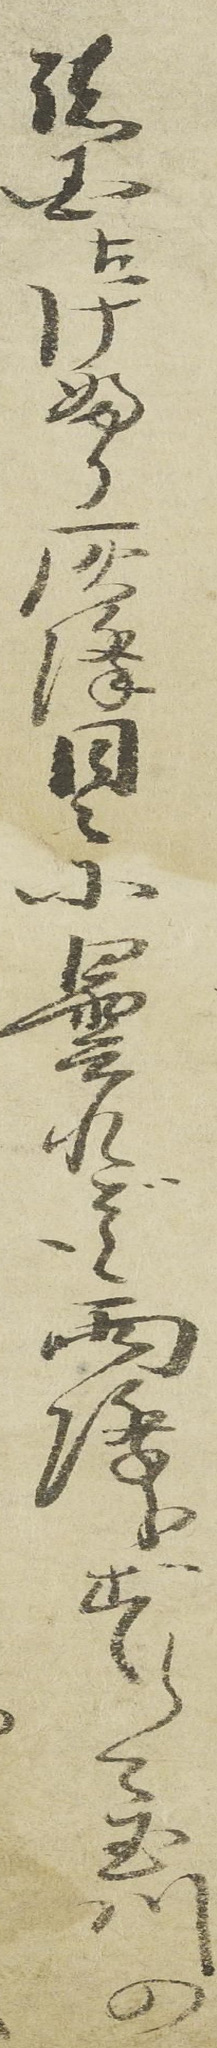諸国えけふり灰降日々に曇れども雨降等して玉川の
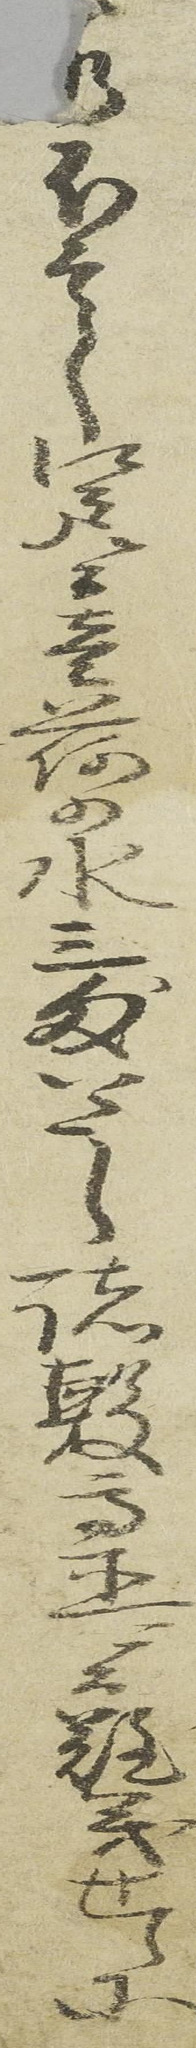不そら江戸ニ而壱荷の水三両いたし諸穀高直ニ而難義せしに
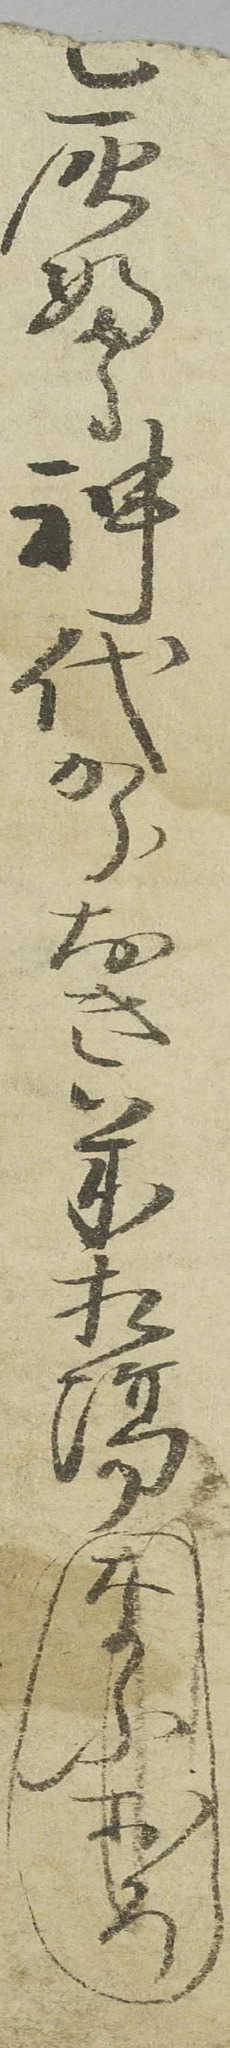灰ふり神代からおき米相場きかふおろ
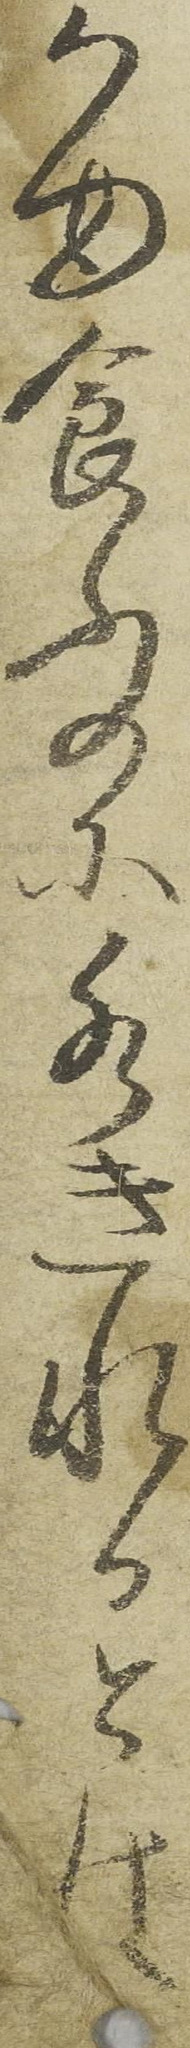かゆ食ふのに水きれるとは

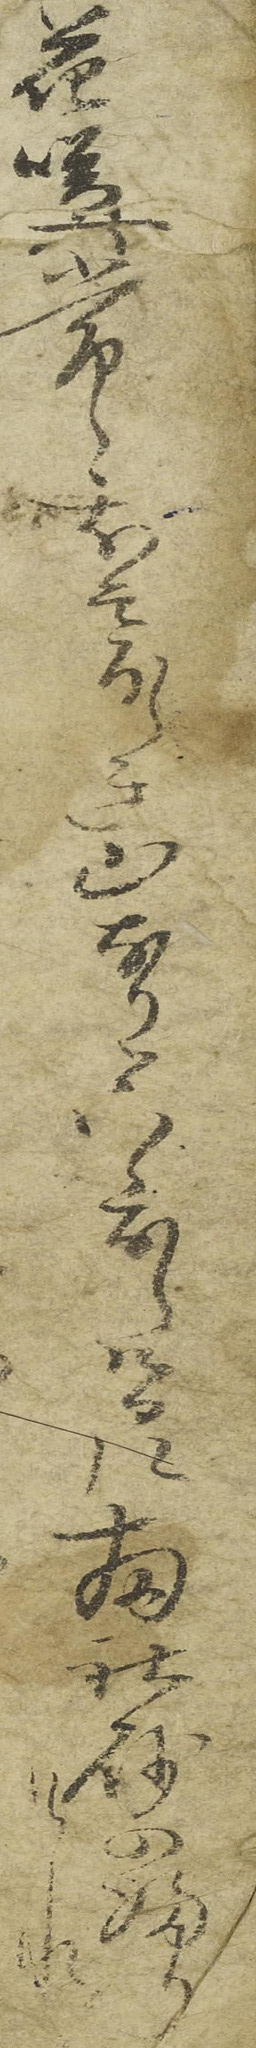花咲常々おそろしき山なりといゝなしけるに扨社砂のふりけれハ
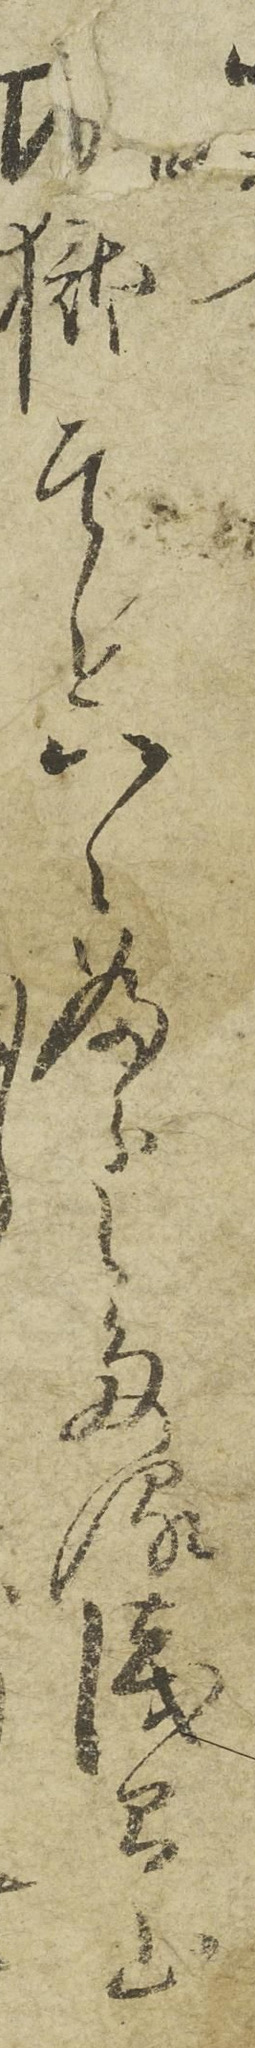獄そとハヽふらしたる浅間山
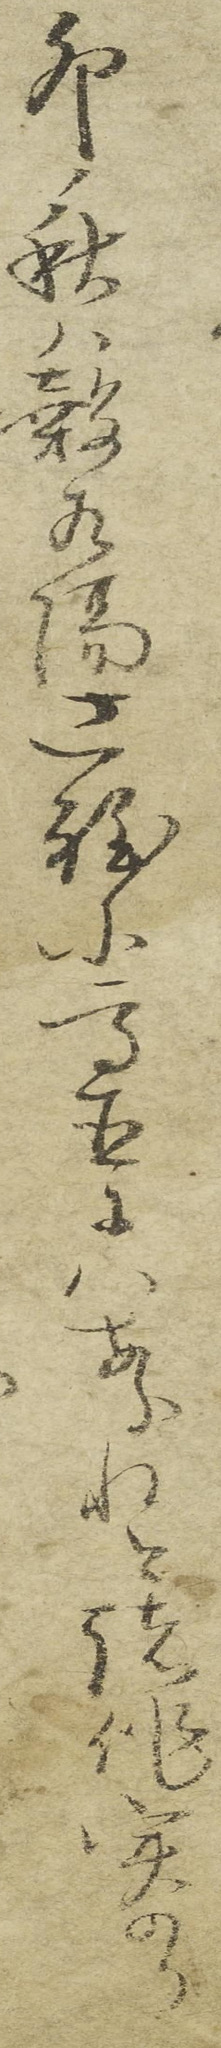卯ノ秋ハ穀相場さ程に高直にハあらねと諸作実のり
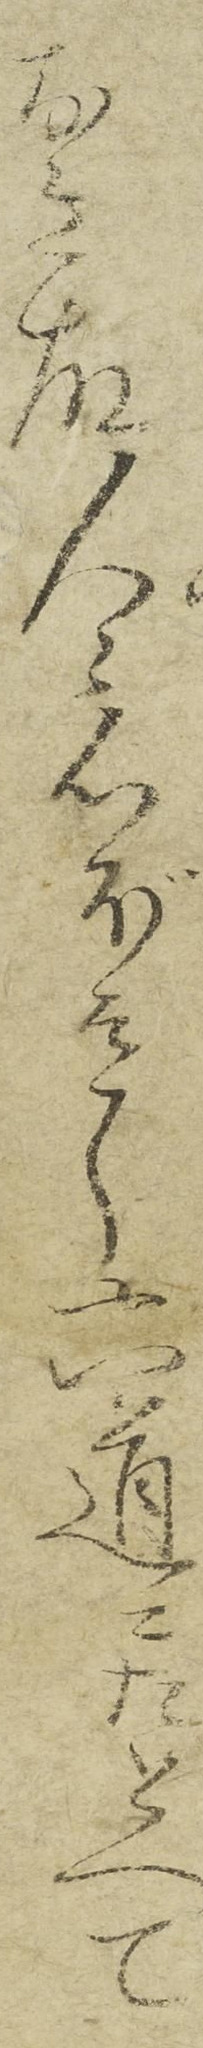なき故人々心ぼそく六道ニたとへて
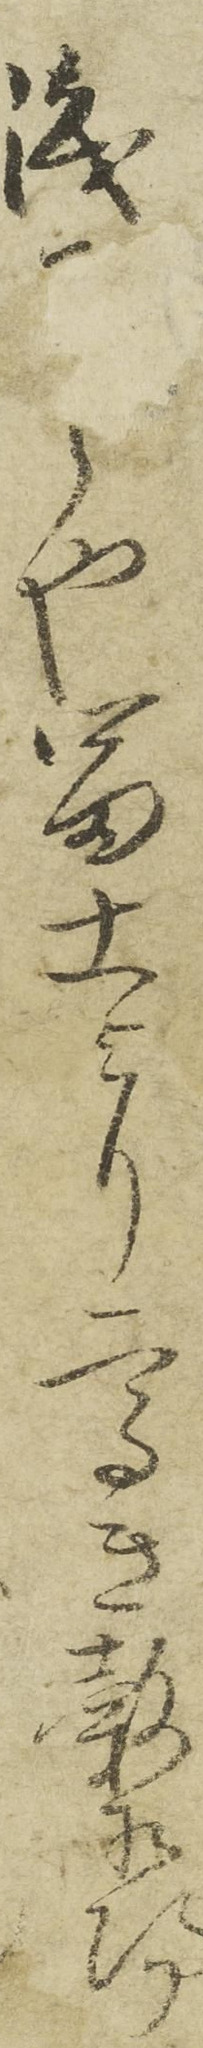浅や富士より高き穀相場
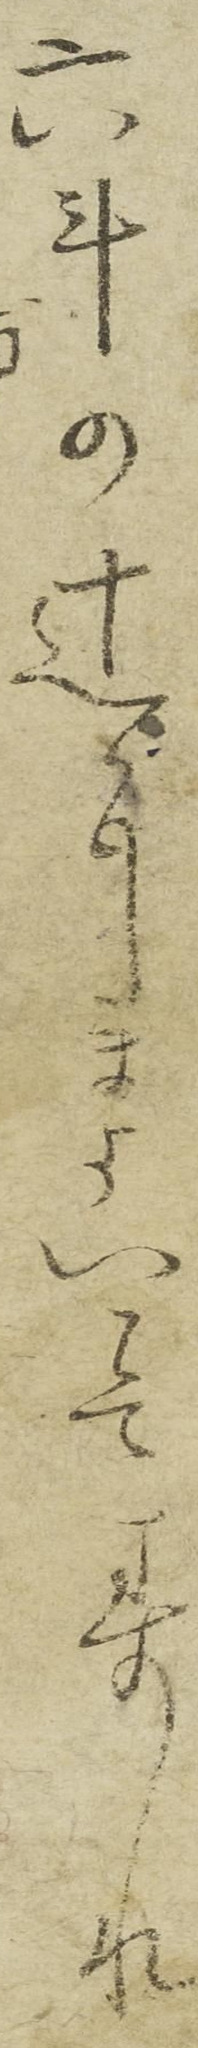六斗の辻にもまよいしてすれ
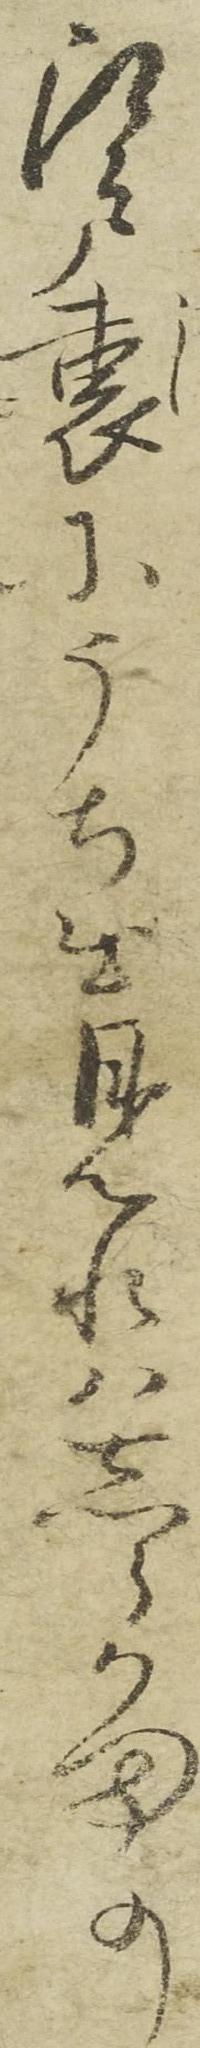江戸裏にうち出見れハしらかゆの
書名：浅間大変略記
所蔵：東京大学地震研究所図書室 Earthquake Research Institute Library, The University of Tokyo, JAPAN
